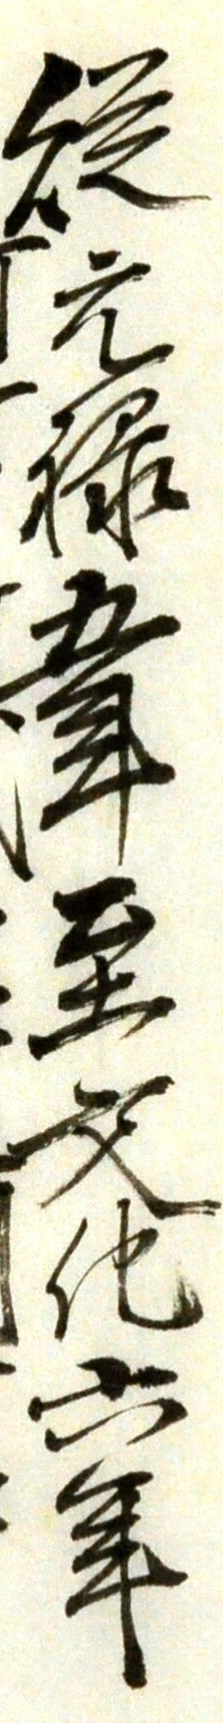従元禄五年至文化六年
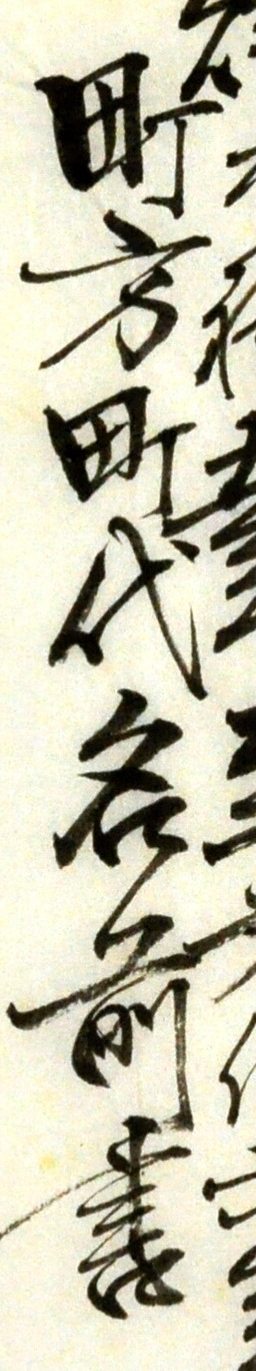町方町代名前書

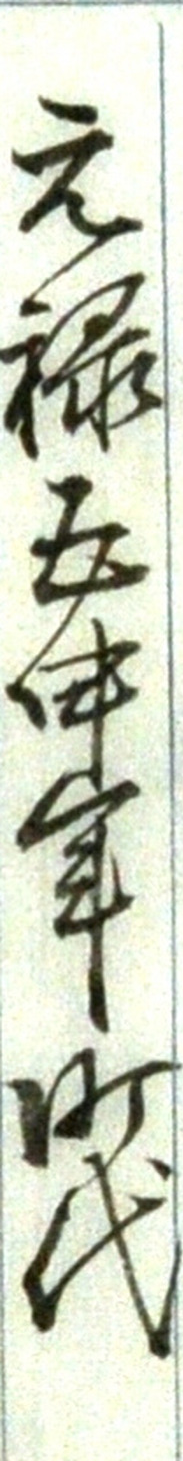元禄五申年町代
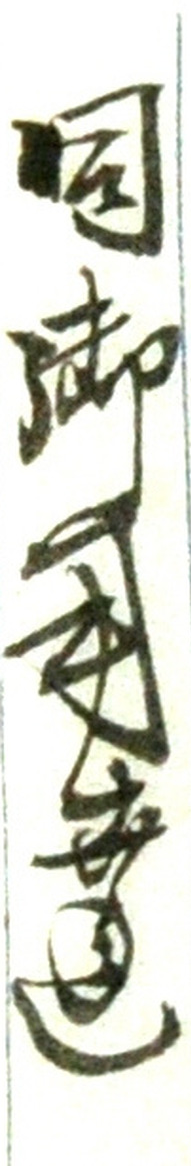同御用達

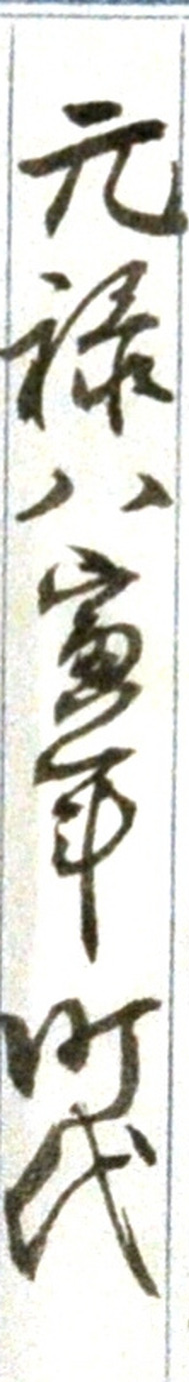元禄八寅年町代
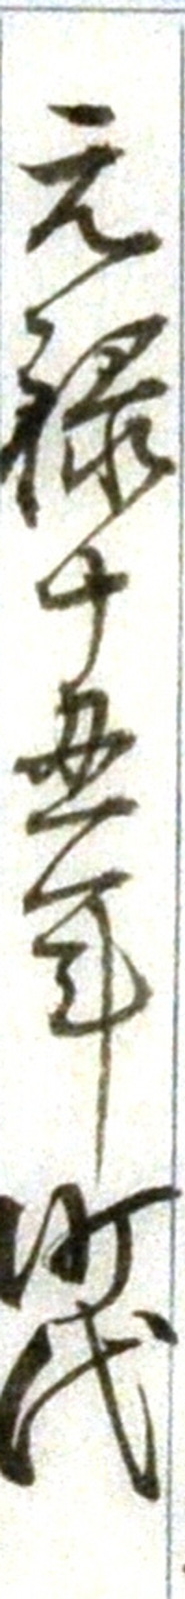元禄十丑年町代
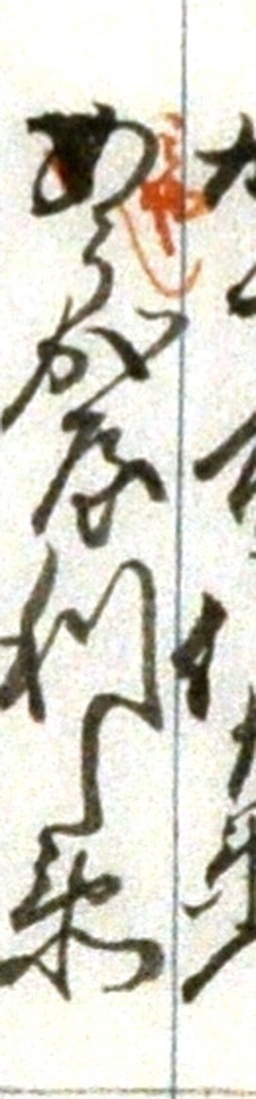めうが屋利兵衛
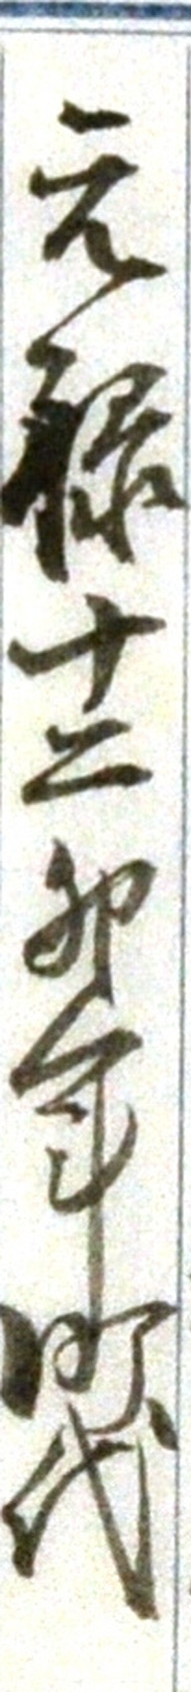元禄十二卯年町代
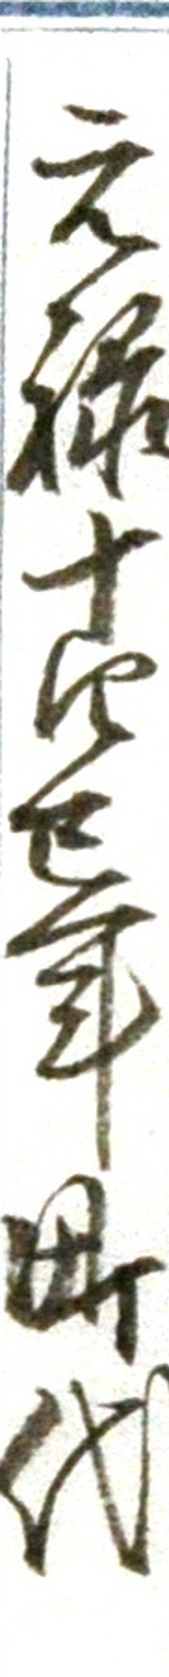元禄十四巳年町代

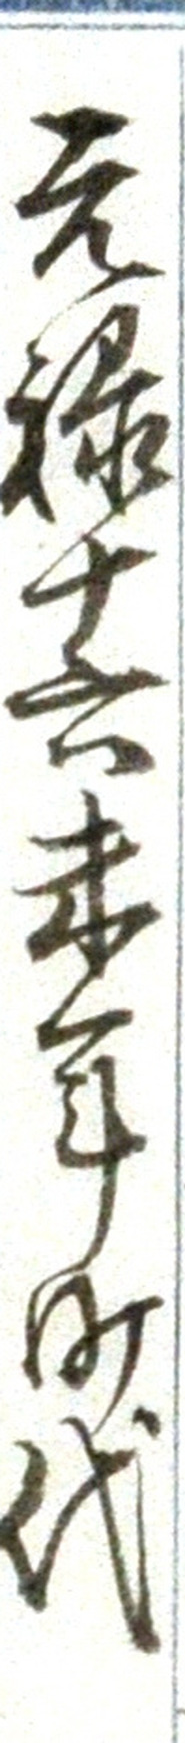元禄十六未年町代
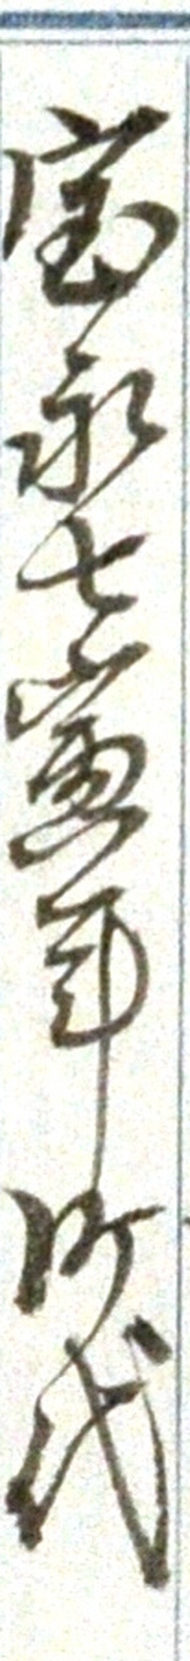宝永七寅年町代
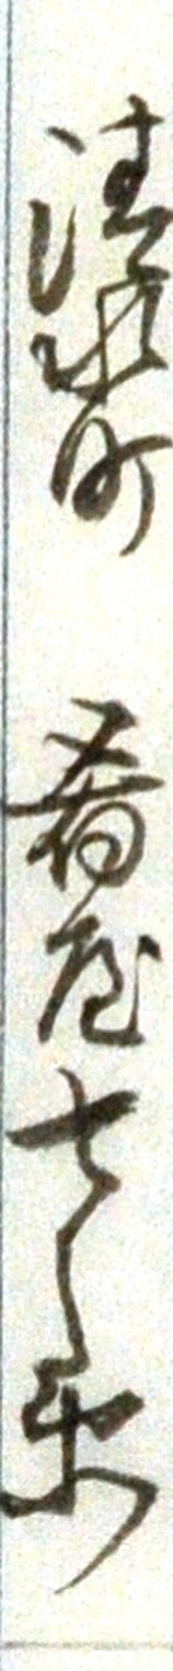清水町肴屋七兵衛
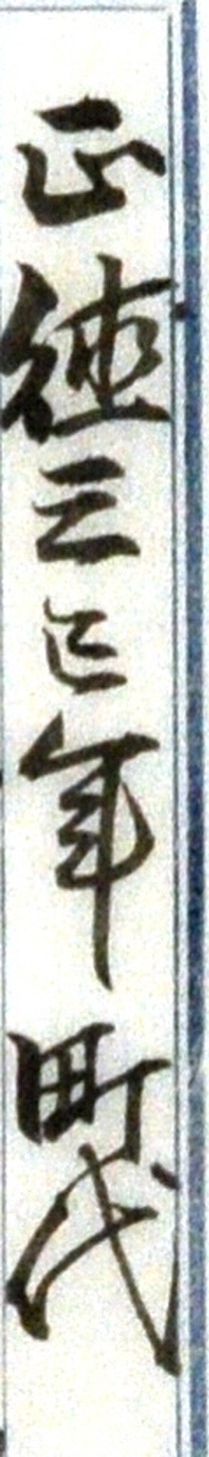正徳三巳年町代
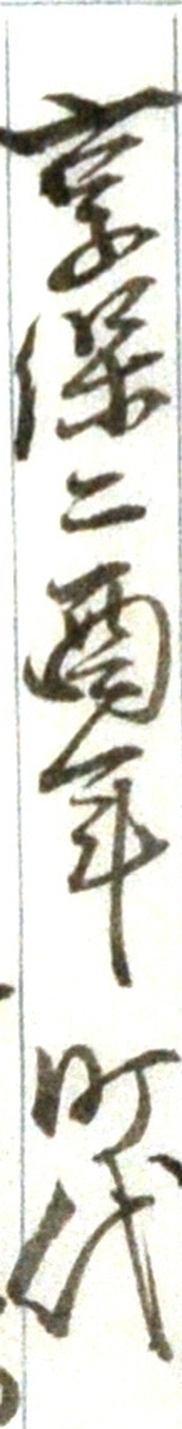享保二酉年町代
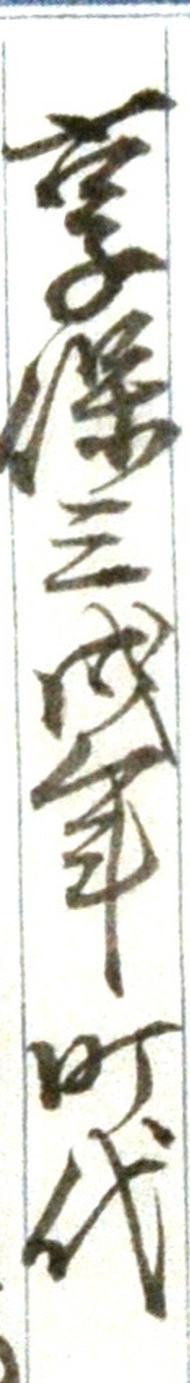享保三戌年町代

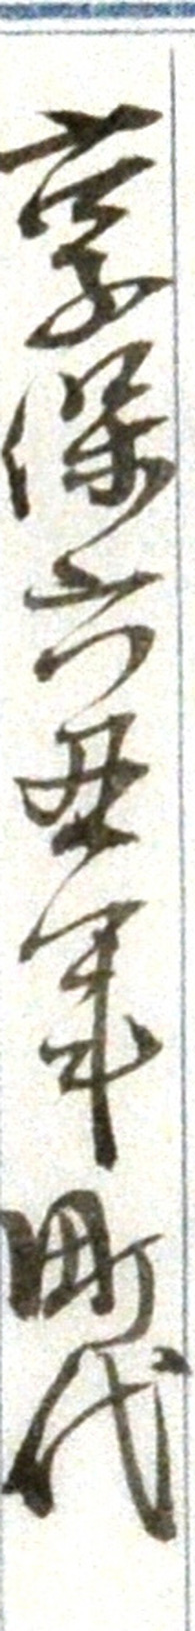享保六丑年町代
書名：町方町代名前書
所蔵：伊那市立高遠町図書館・合同会社AMANE
